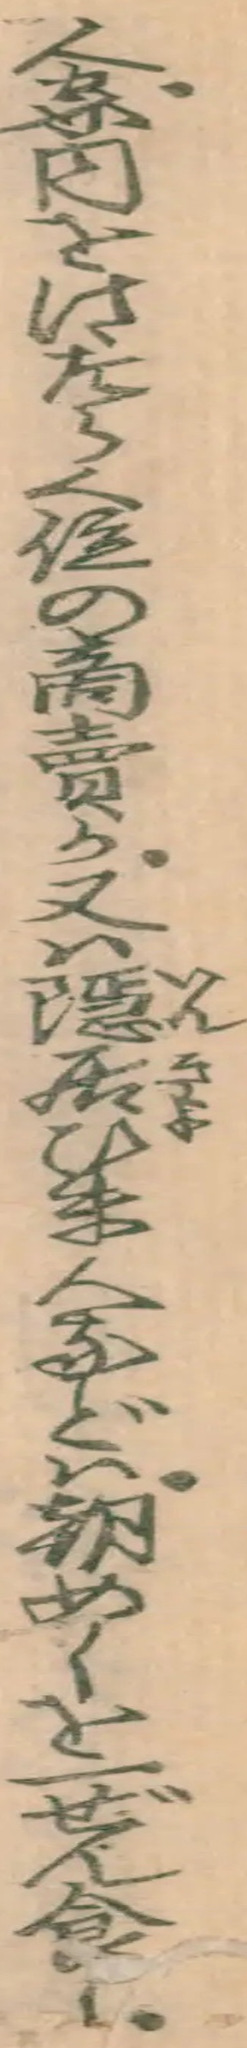人．家内をはたらく位の商売か．又は隠居ひま人などは．朝めしを一ぜん食し．
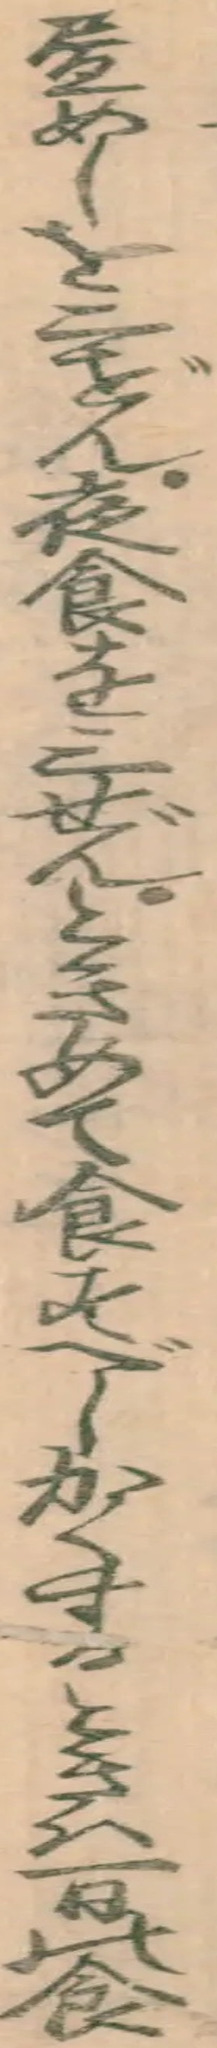昼めしを二ぜん．夜食を三ぜん．ときめて食すべしかくするときは一日の食
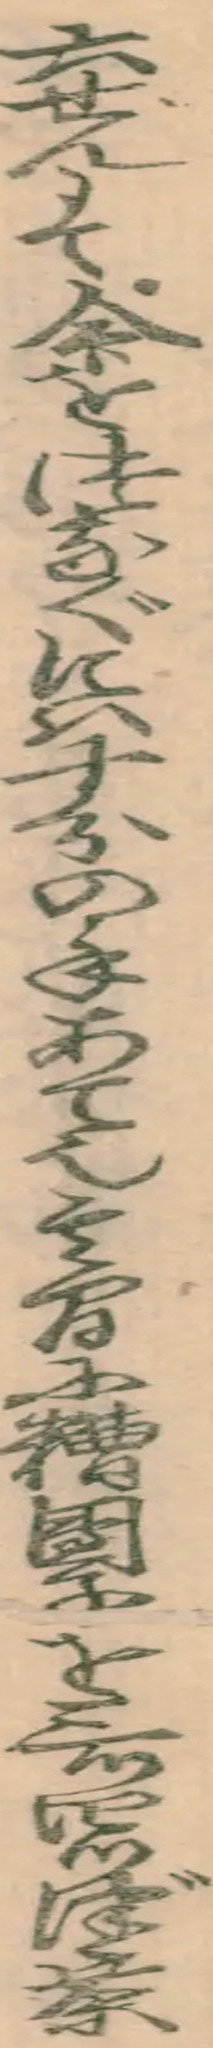六ぜんにて．命をつなぐには十分の手あて也其間に糟団子を三ッ四ッづゝ茶
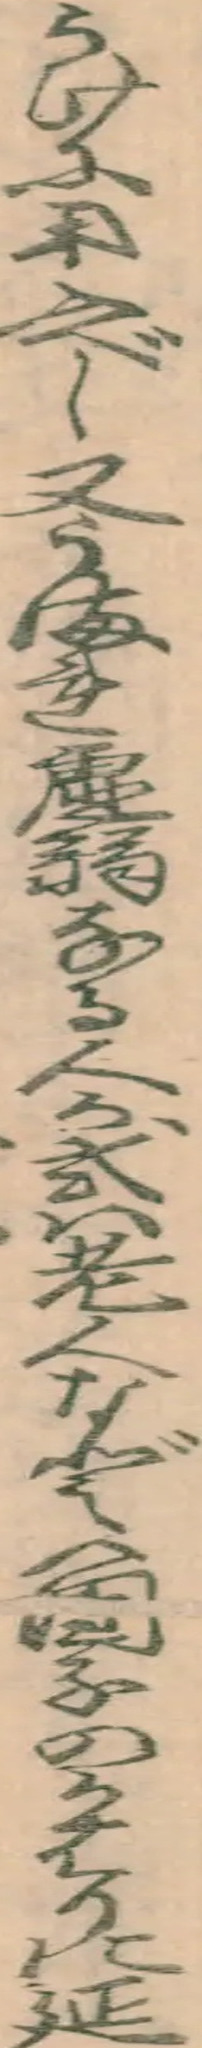うけに用ふべし又うまれ虚弱なる人か式は老人などへ団子のかはりに延
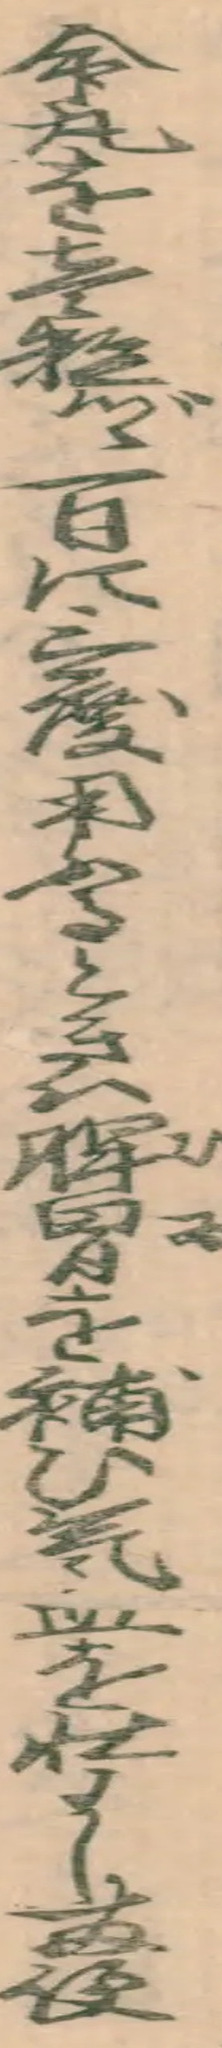命丸を壱粒づゝ一日に三度用ふるときは脾胃を補ひ気血を壮にし両便
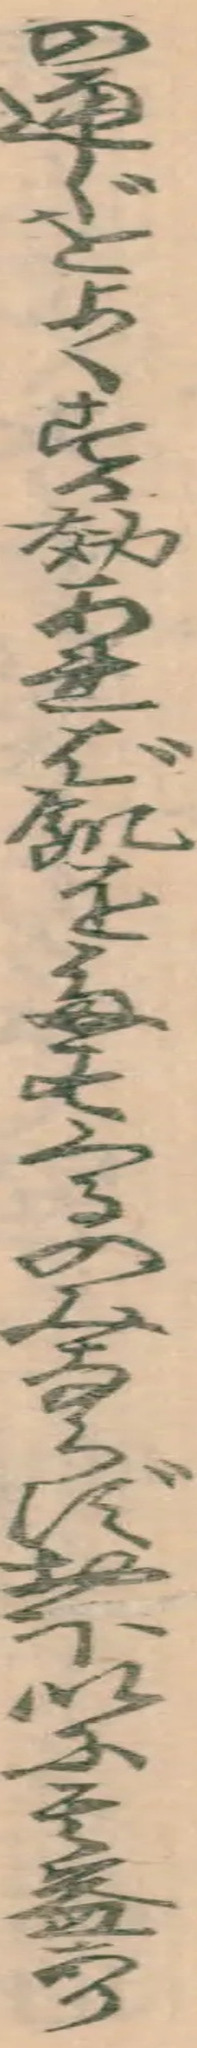の通じをよくする効あれば飢をたすくるのみならずおほいに其益あり
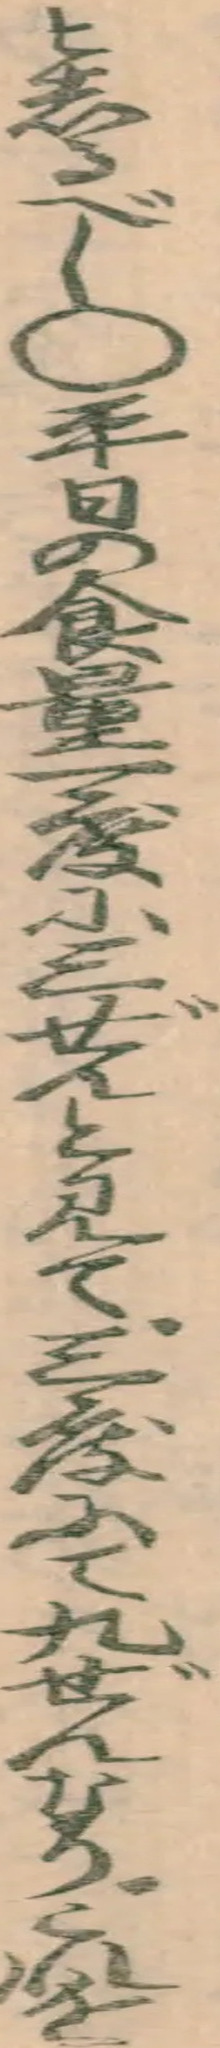としるべし○平日の食量一度に三ぜんと見て．三度にて九ぜんなり．これを
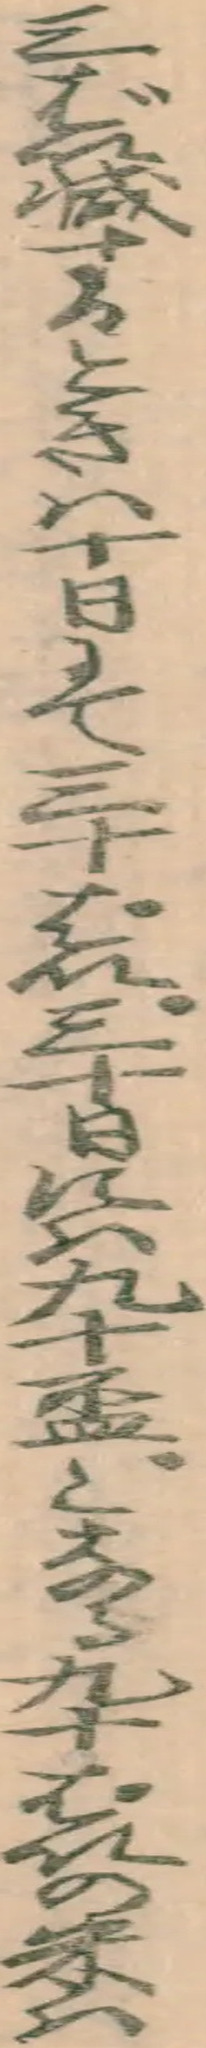三ばい減するときは十日にて三十ぱい．三十日には九十盃．となる九十ぱいの米は
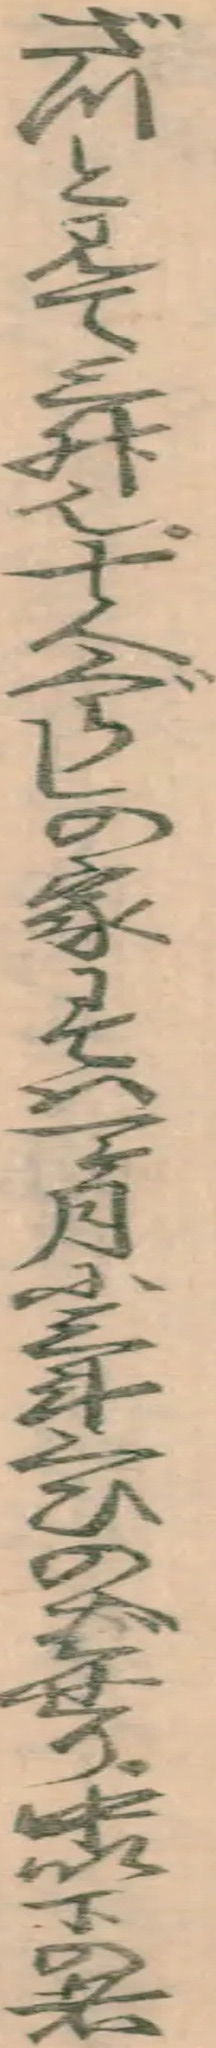ざつと見て三升也．十人ぐらしの家にては一ヶ月に三斗くひのばせり．中以下の者
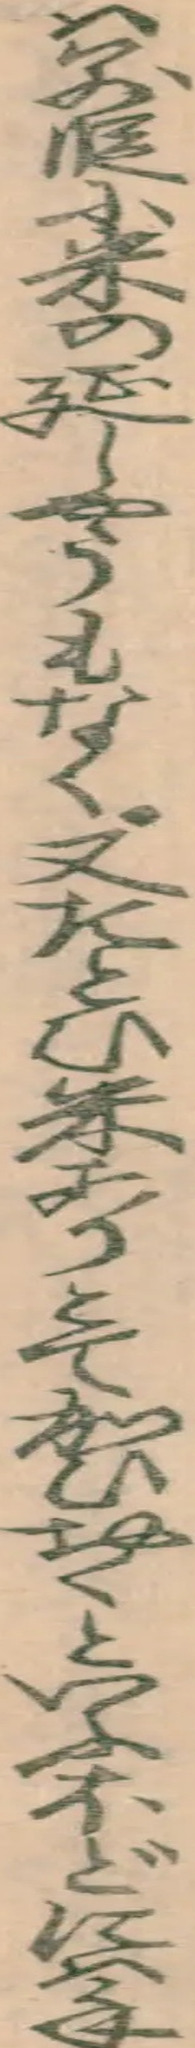は別段に米の延しやうもなく．又たとひ米ありとてかひおくといふほどには手
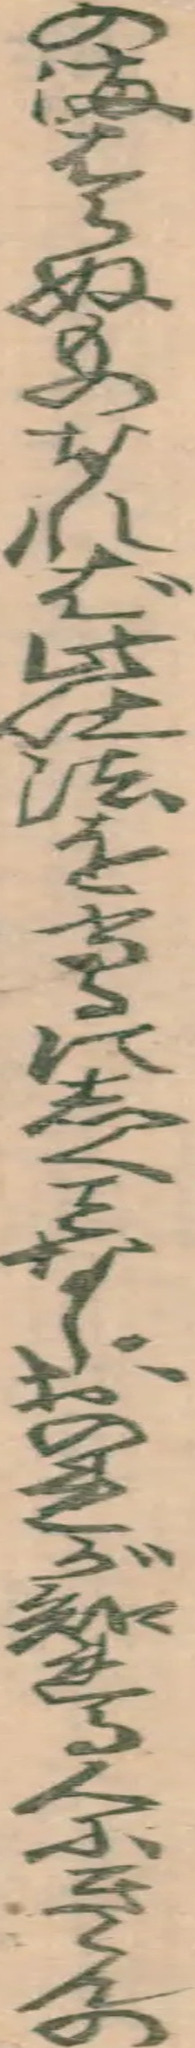のまはらぬものなれば此仕法を守るにしくことなし．おのれが知れる人にきゝんの
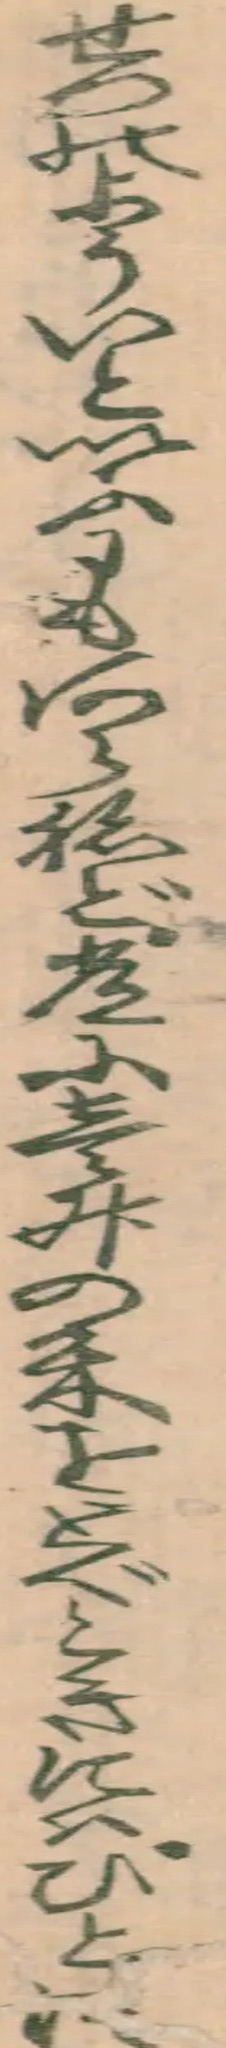せつのよういといふにもあらねど．常に壱升の米をとぐときには．ひと
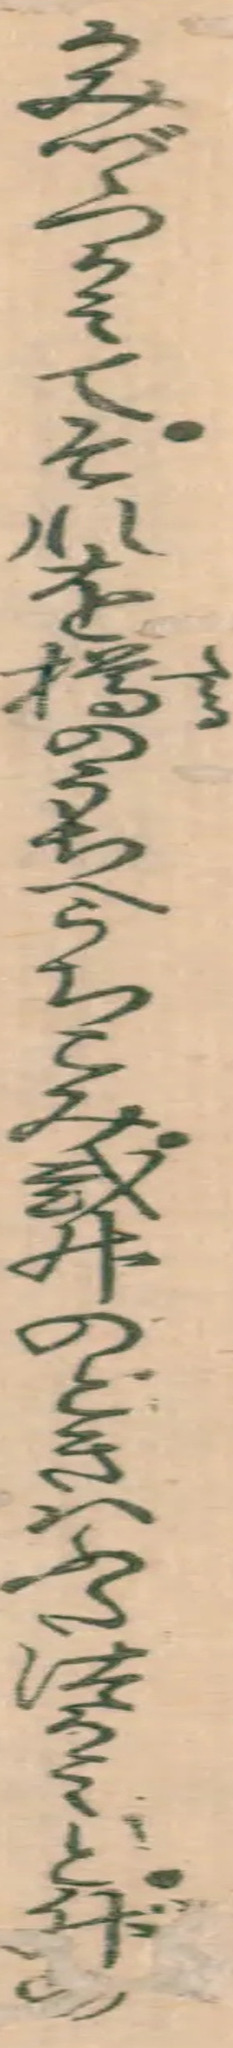かみづゝつかみて．それを樽のうちへうちこみ．弐升のときはふたつかみと升の
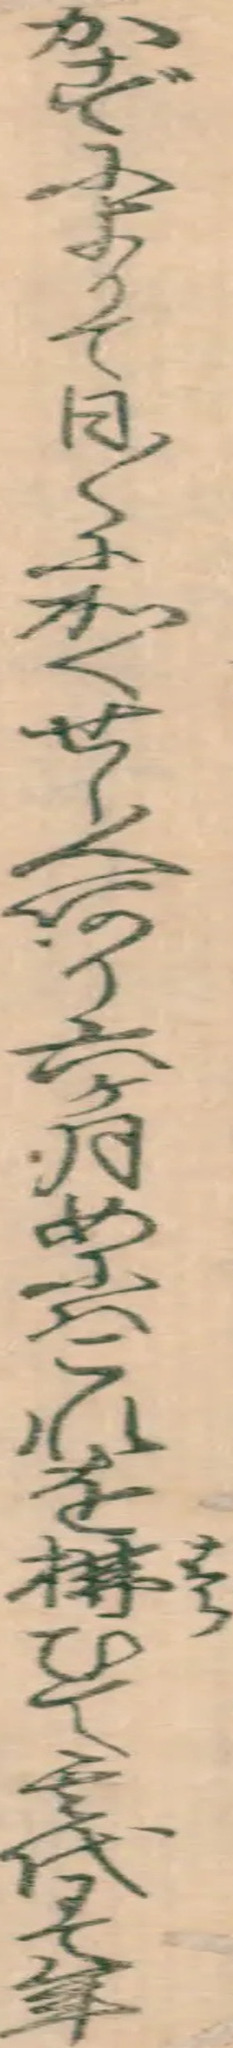かずによりて日〳〵にかくせし人あり六ヶ月めにはこれを払ひて其代にて年
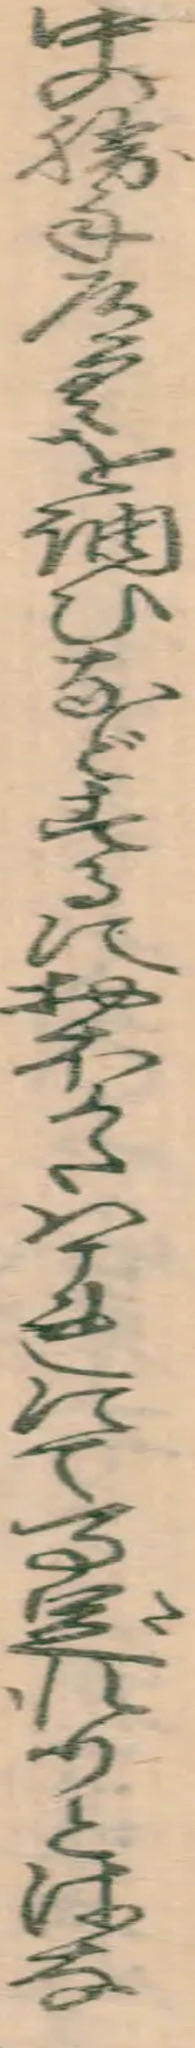中の勝手道具を調ひなどするにおほかたはこれにて事足れりとはなしゝ
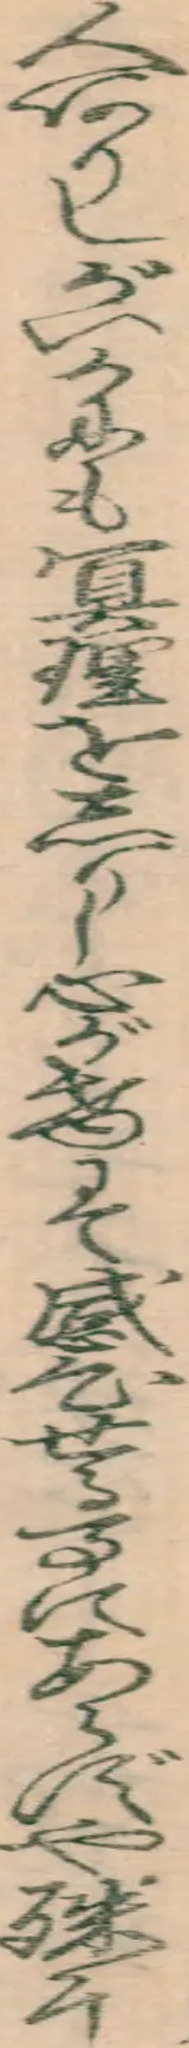人ありしがいかにも冥理をしりし心がけにて感心せる事にあらずや殊に
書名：日ごとの心得
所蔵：国立国会図書館 National Diet Library, JAPAN
